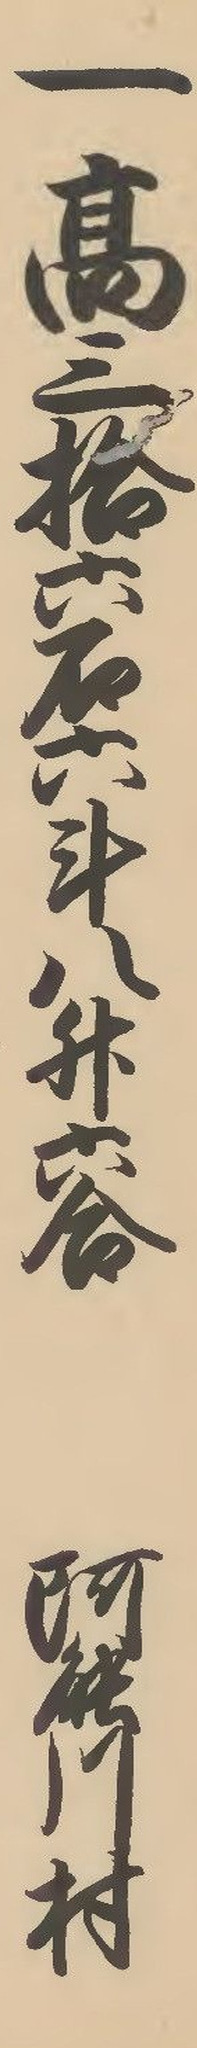一髙三拾六石六斗八升六合阿能川村
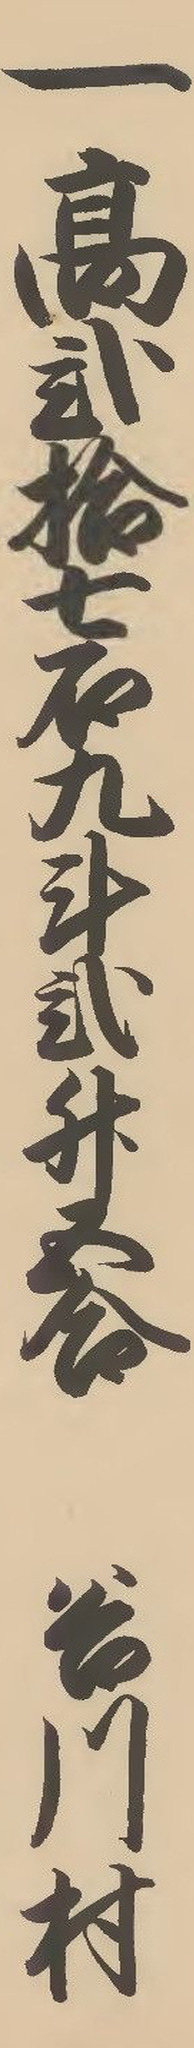一髙弐拾七石九斗弐升五合谷川村
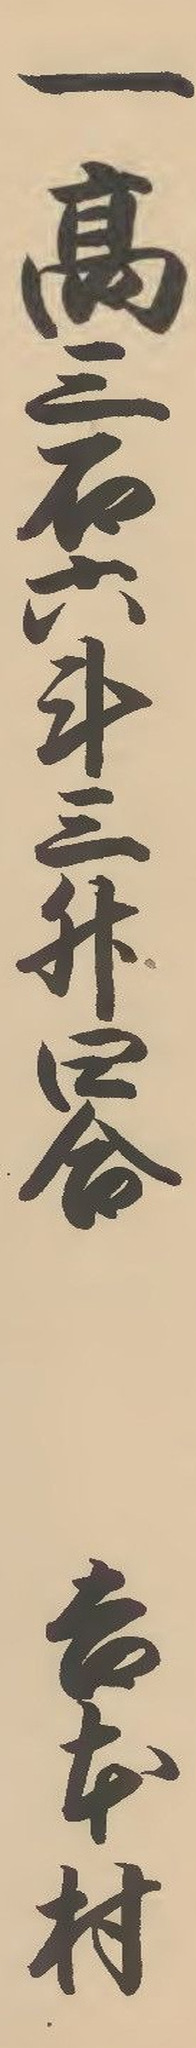一髙三石六斗三升四合吉本村
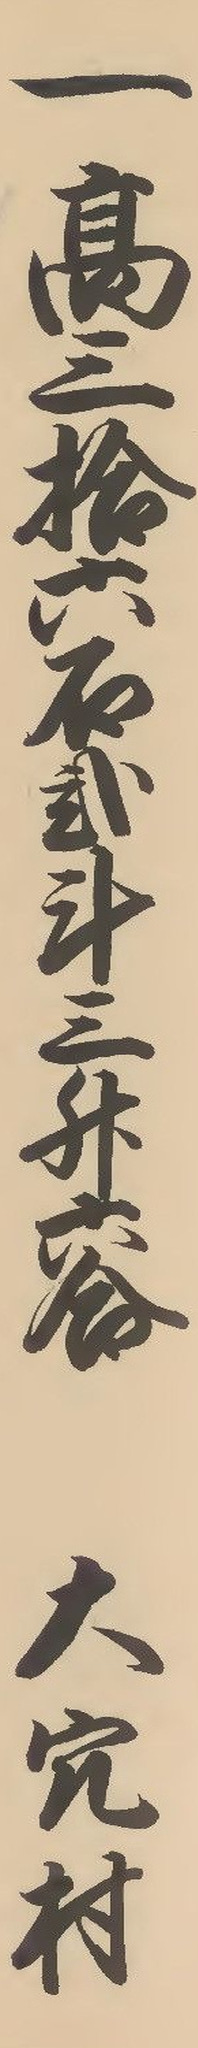一髙三拾六石弐斗三升六合大穴村
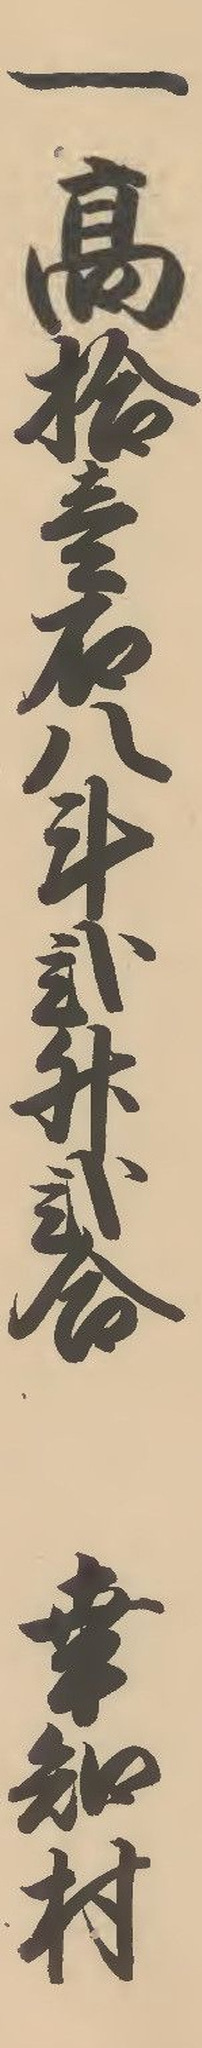一髙拾壱石八斗弐升弐合幸知村
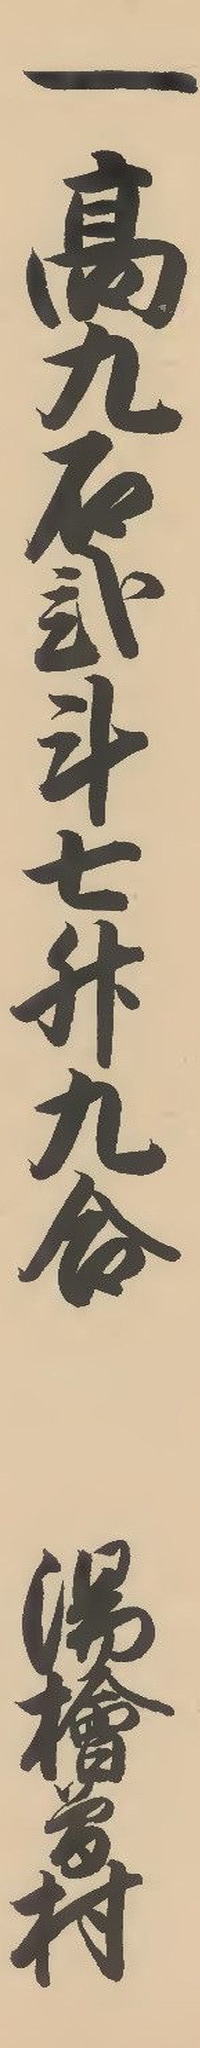一髙九石弐斗七升九合湯檜曽村
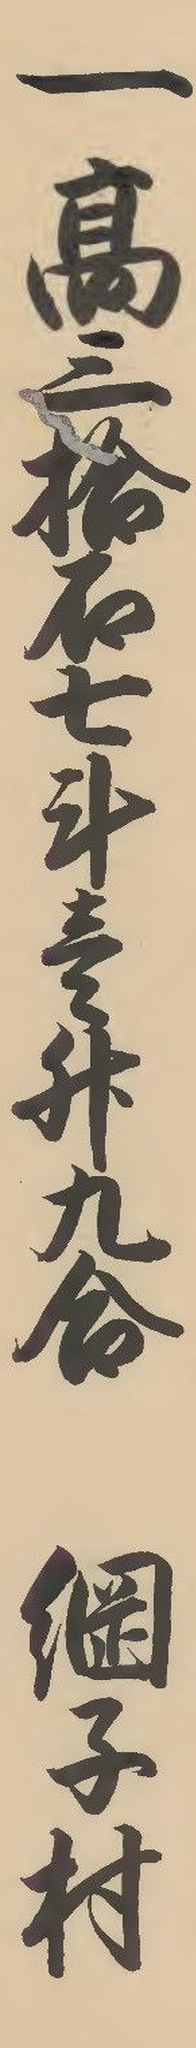一髙三拾石七斗壱升九合綱子村

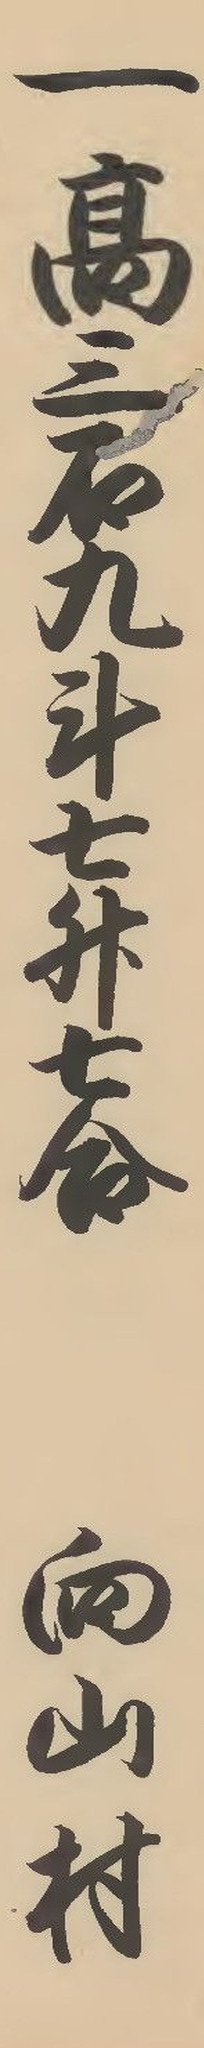一髙三石九斗七升七合向山村
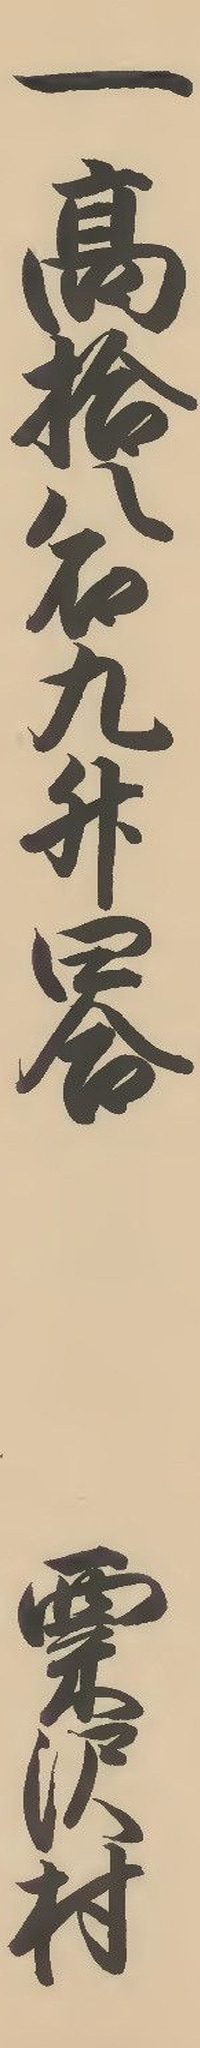一髙拾八石九升四合栗沢村
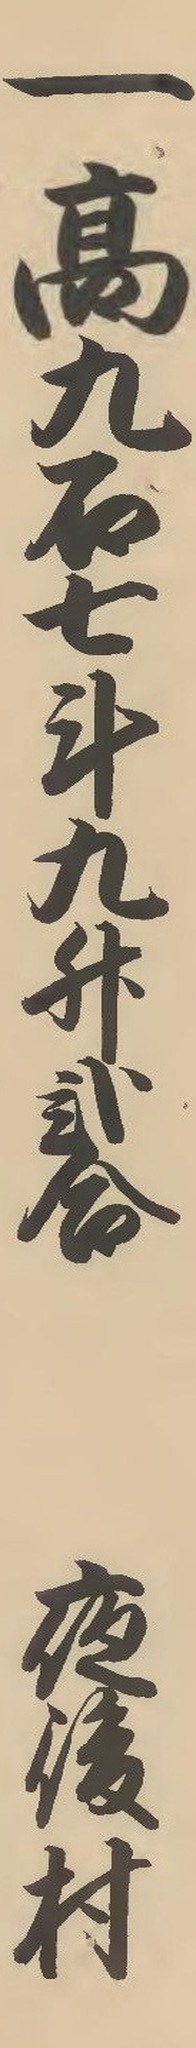一髙九石七斗九升弐合夜後村
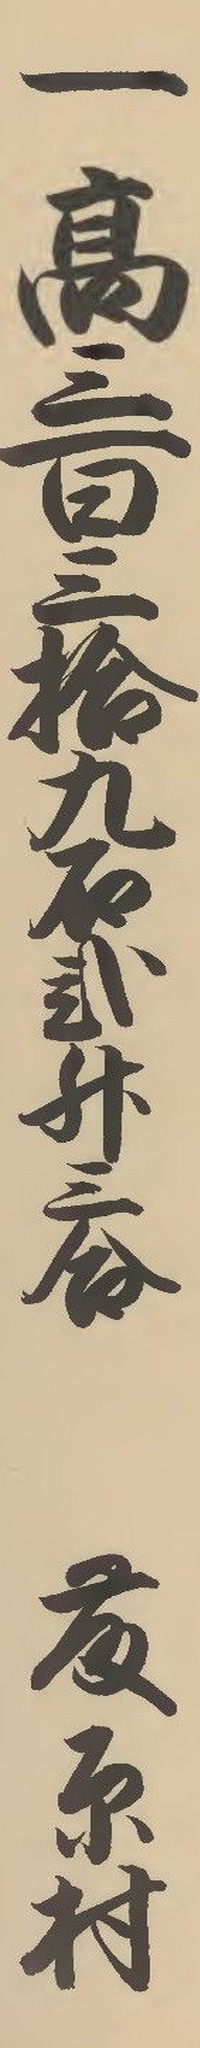一髙三百三拾九石弐升三合藤原村
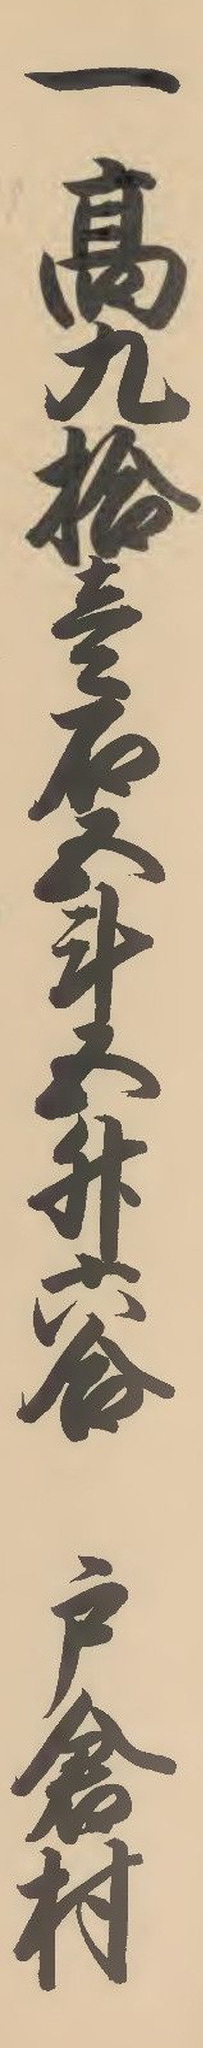一髙九拾壱石五斗五升六合戸倉村
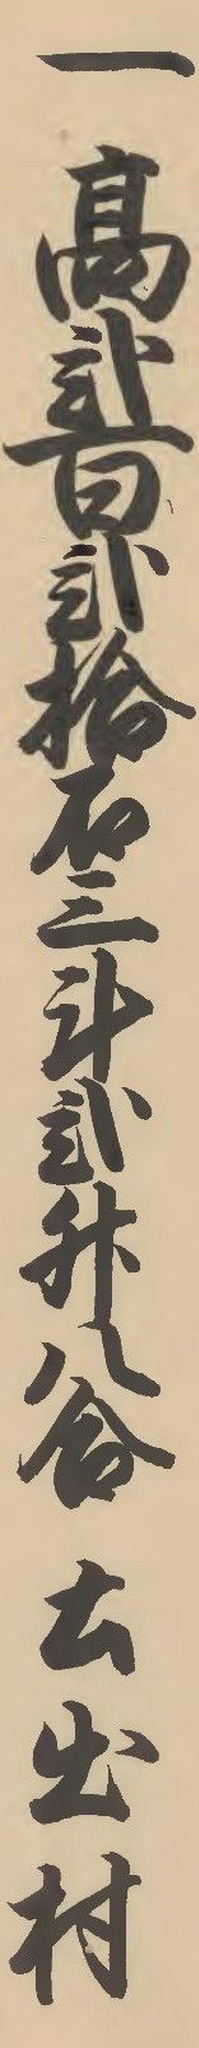一髙弐百弐拾石三斗弐升八合土出村
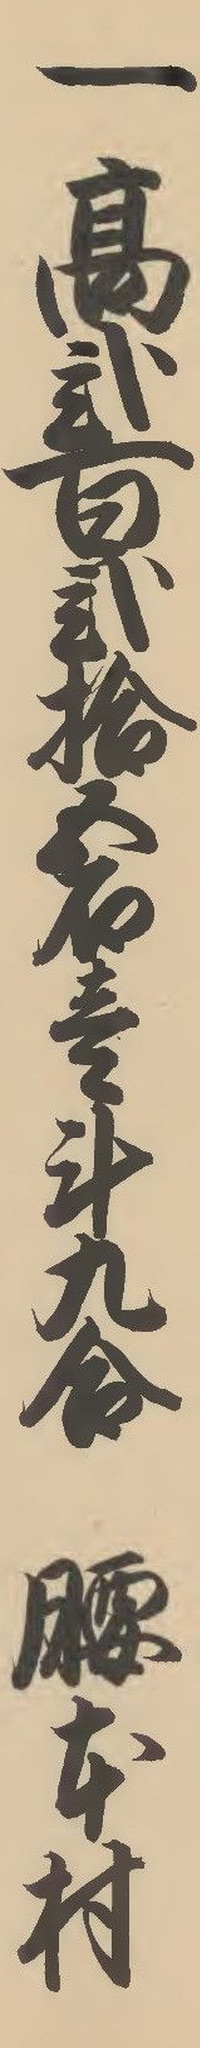一髙弐百弐拾五石壱斗九合腰本村
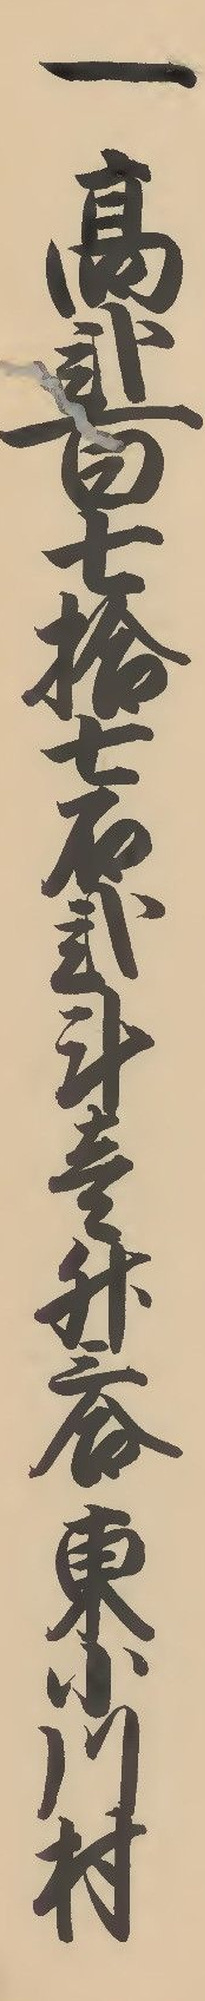一髙弐百七拾七石弐斗壱升三合東小川村

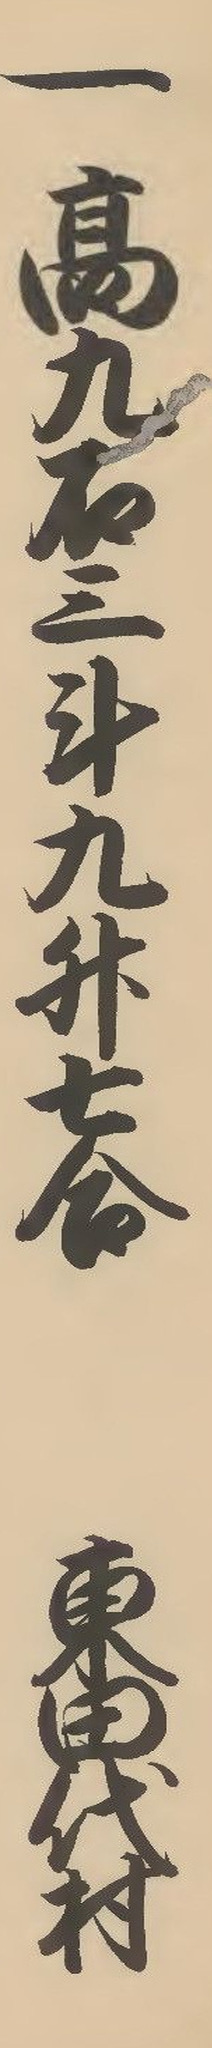一髙九石三斗九升七合東田代村
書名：上野国郷帳
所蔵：国立公文書館 National Archives of Japan
